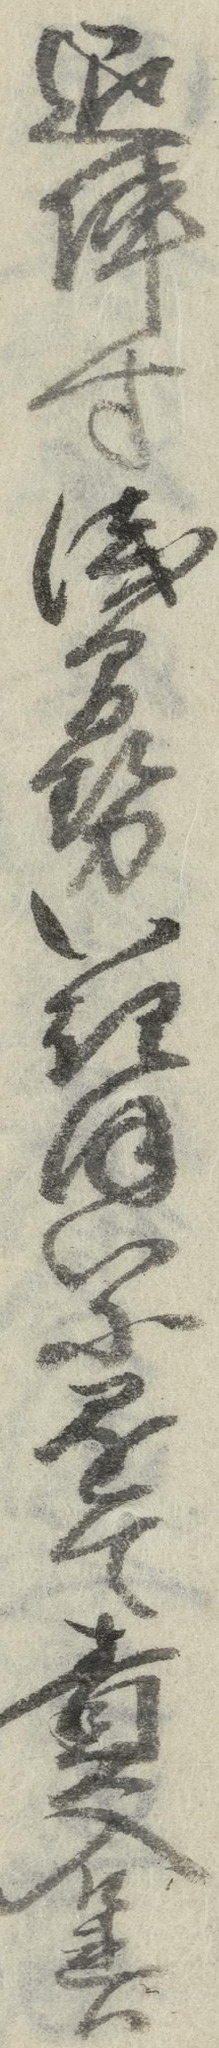退陣す浅間勢いきほいに懸て責入けれは
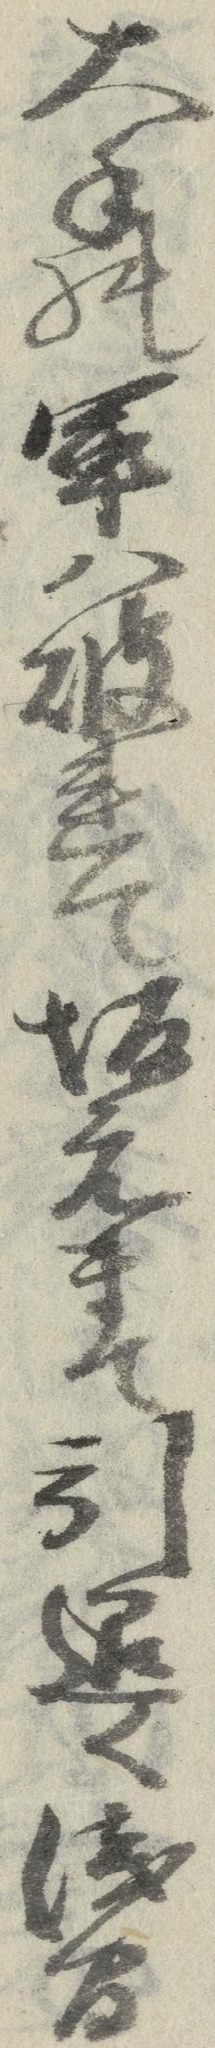大手の軍は破れて坂元まて引退く浅間
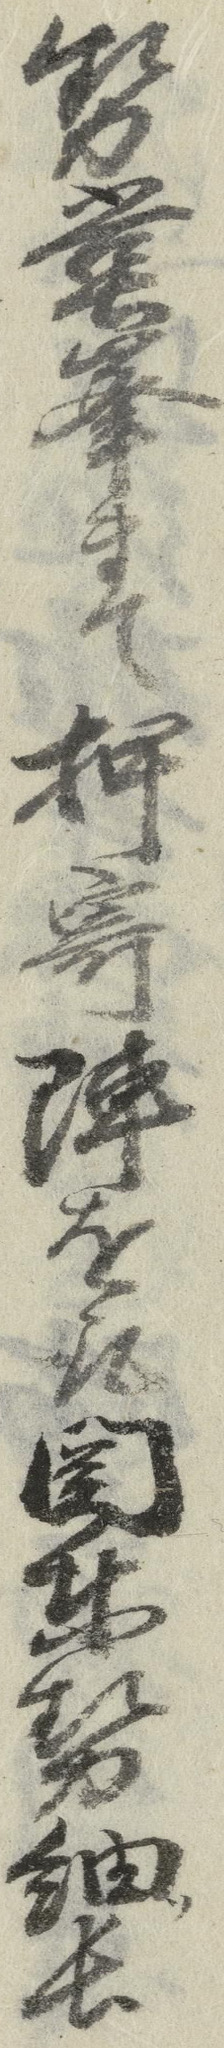勢堂峯まて押寄陣を取関東勢紬長
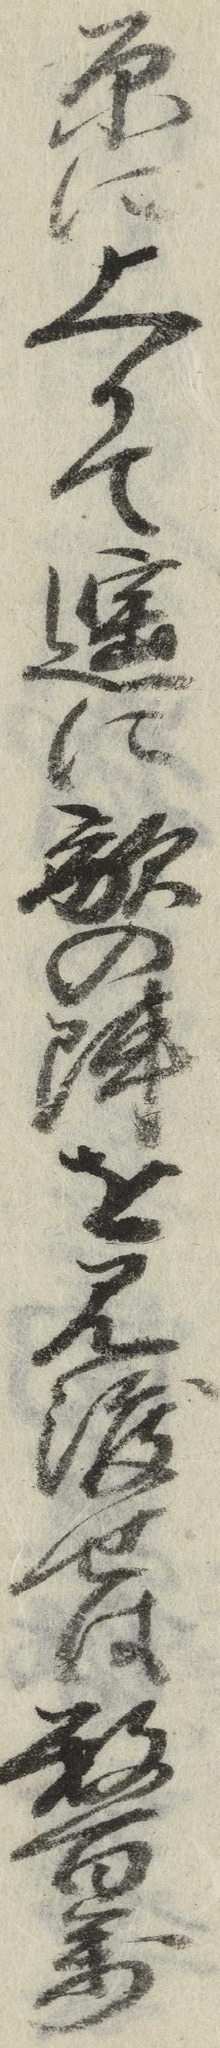原に上りて遥に敵の陣を見渡せは数百万
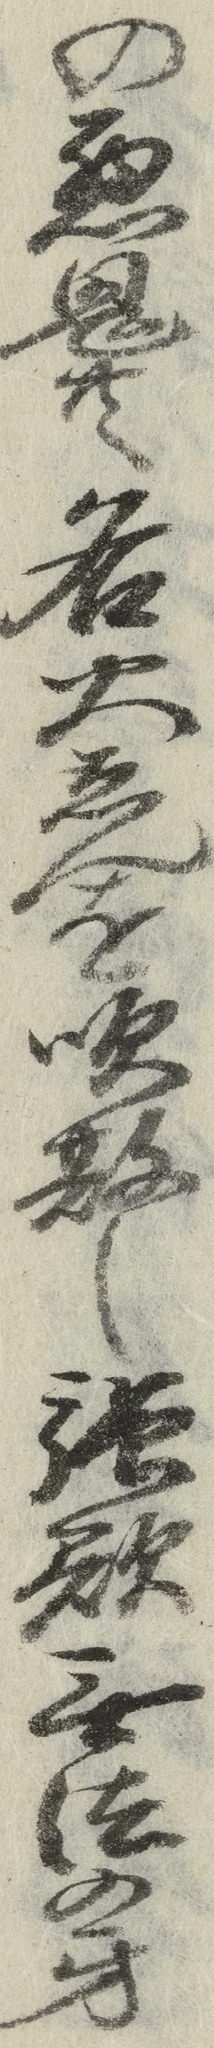の悪鬼共各火ゑんを吹散し強欲無法の牙
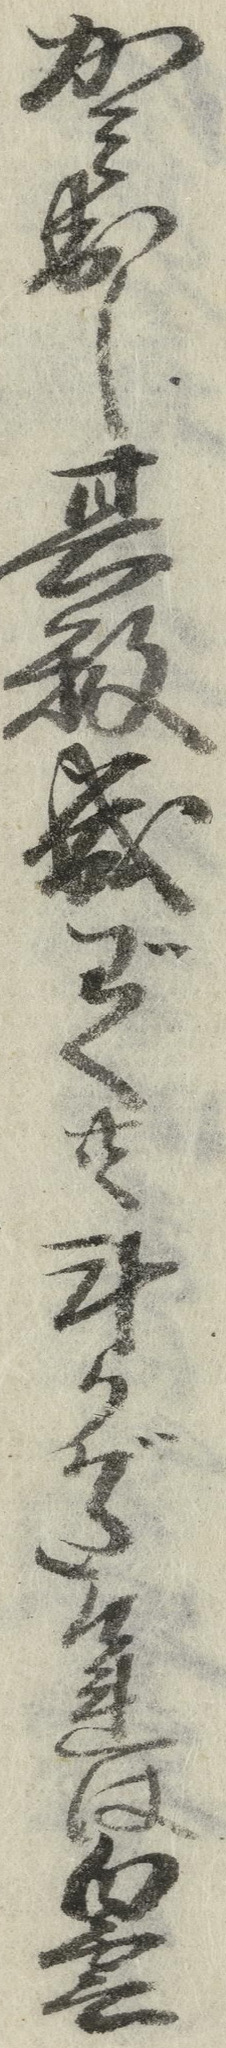かみ出し其数幾ばく共計りがたけれは白雲
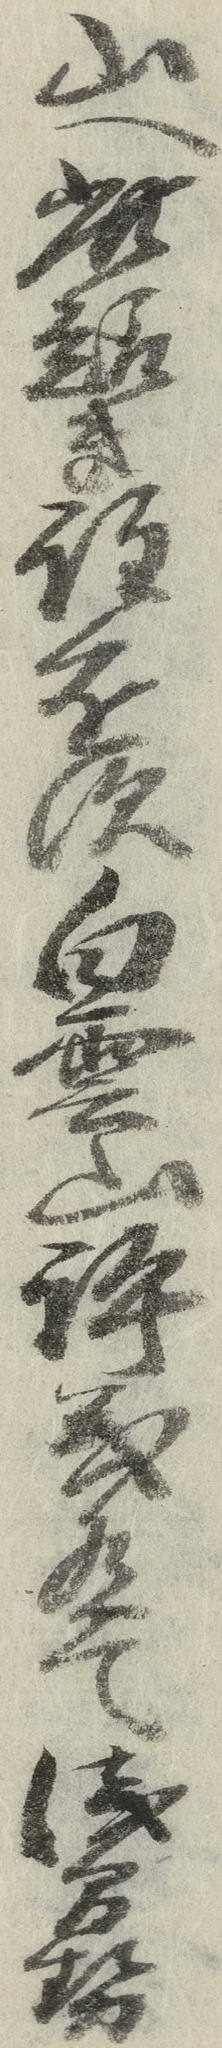山へ此趣き注進す白雲山評義有て浅間勢
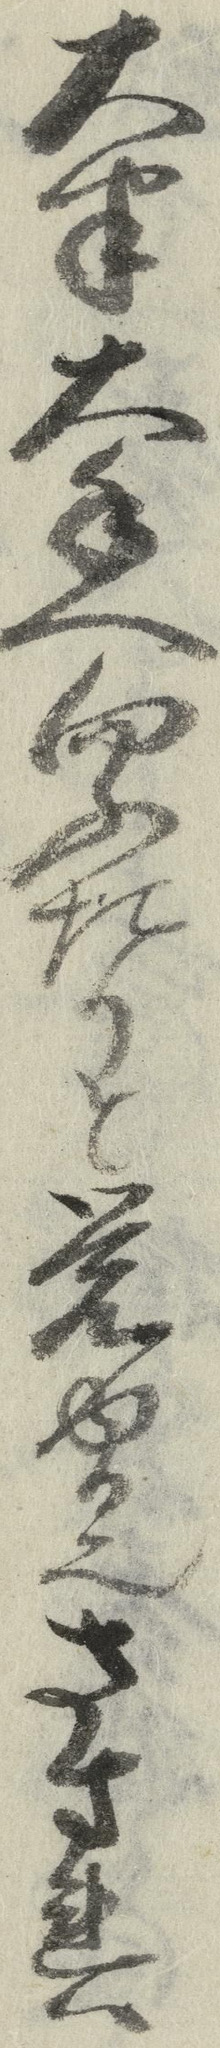大半大手へ向ふたりと覚ゆる也さすれは
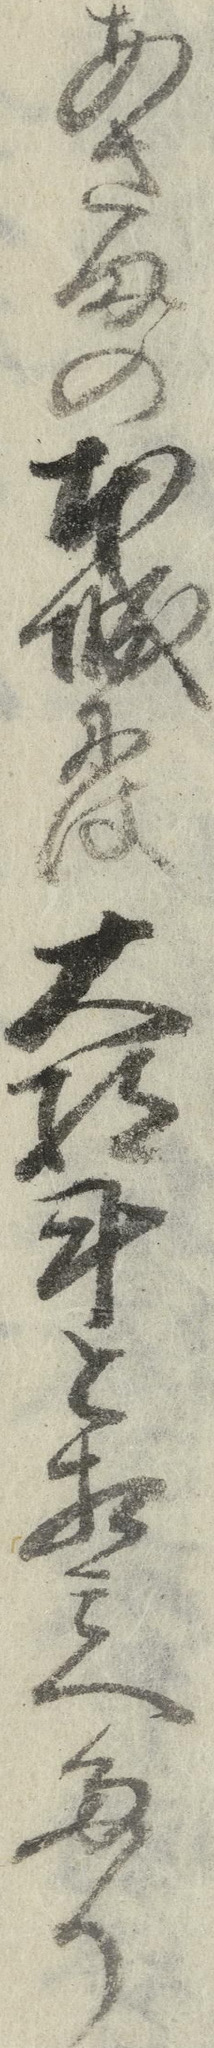あさまの本城には大将計と相みへたり
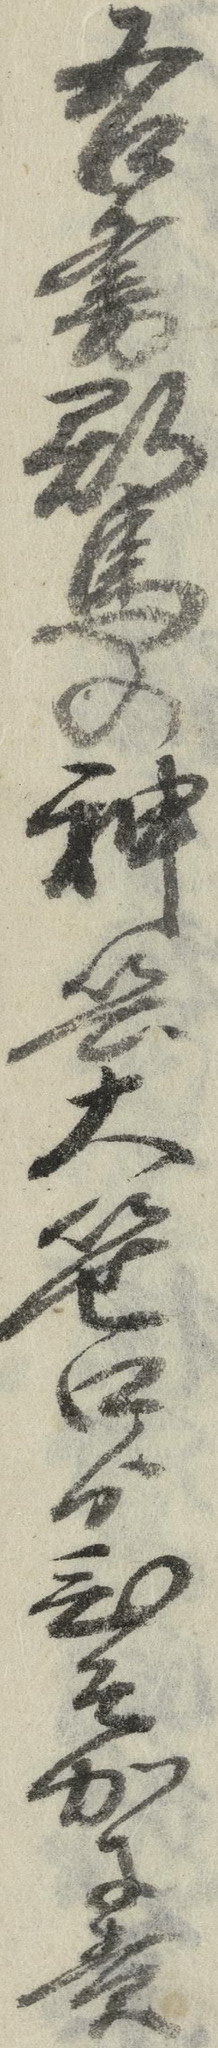吾妻郡馬の神岳大笹口ゟひそかに責

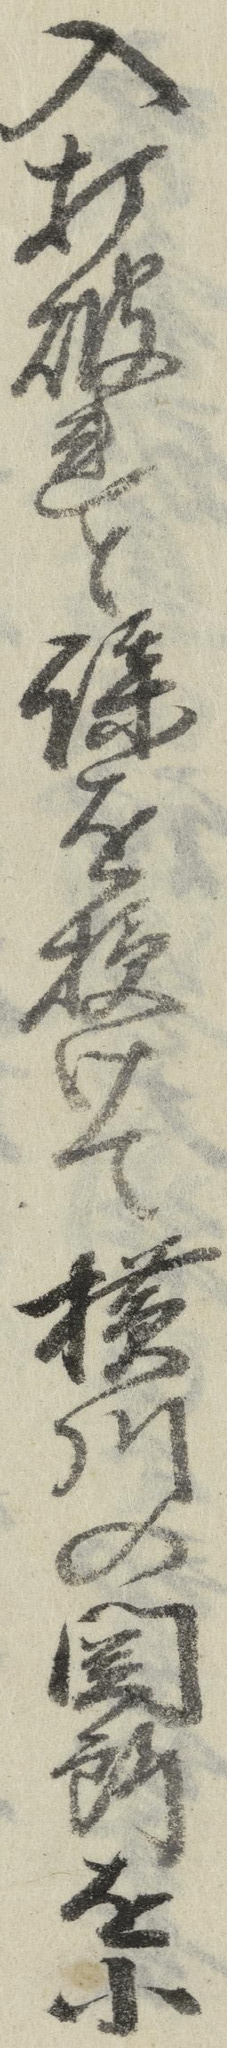入打破れと謀を授けて横川の関所を小
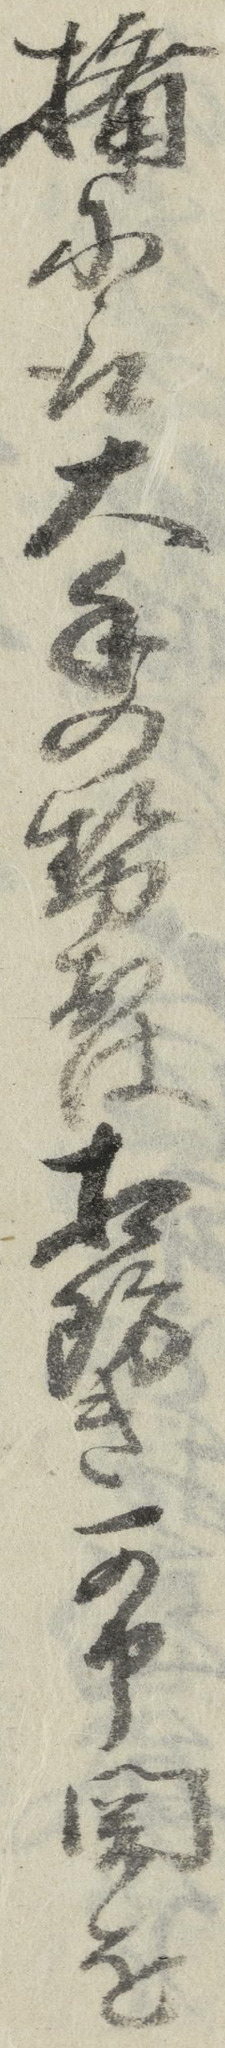播に取大手の勢おは相防き可申関を
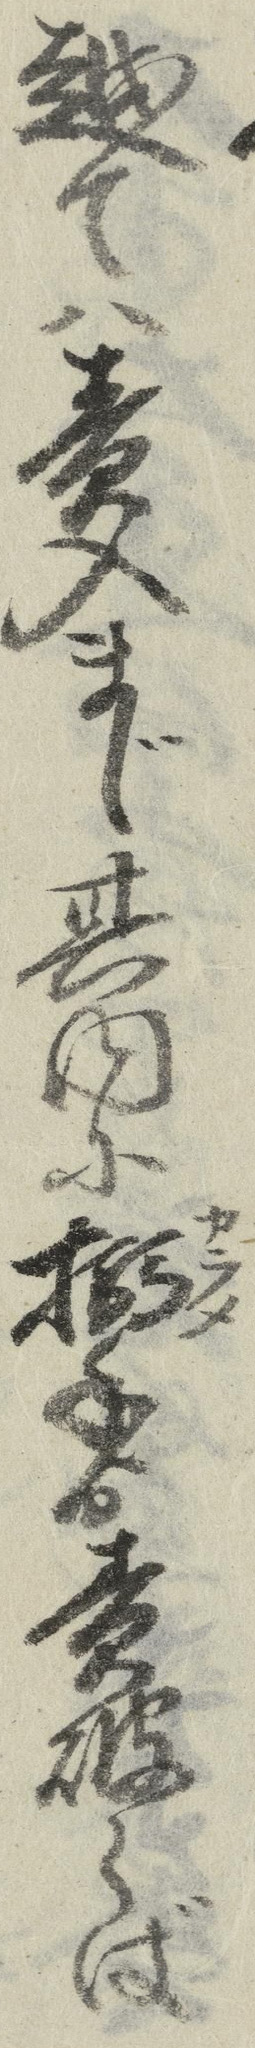越ては責入まじ其内に搦手ゟ責破らば
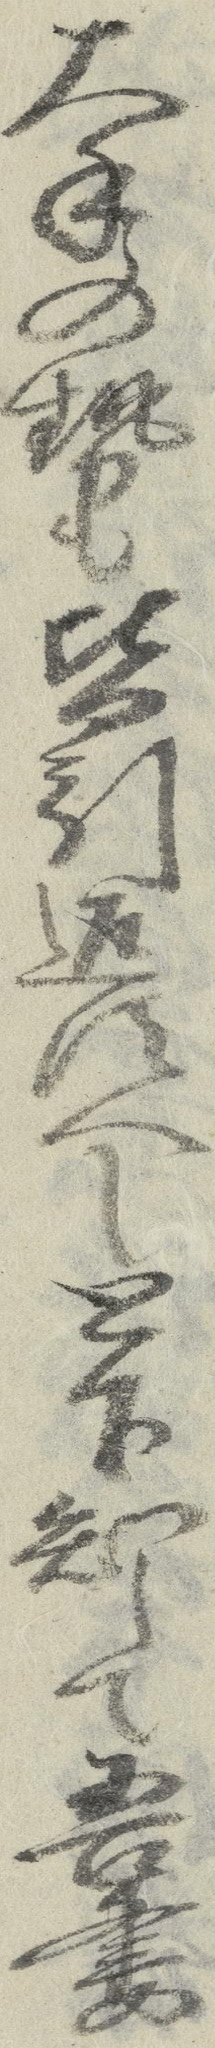大手の勢も皆引返すへしと下知して吾妻
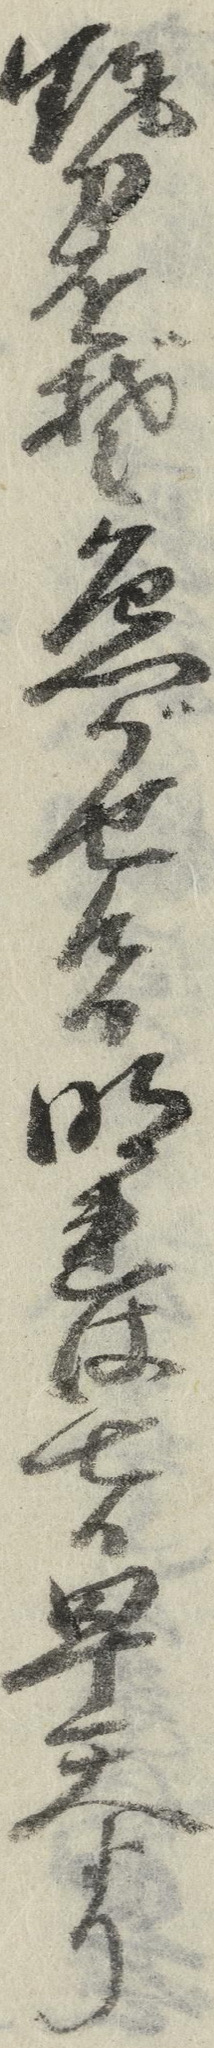勢をぞ急がせける明れは七日早天より
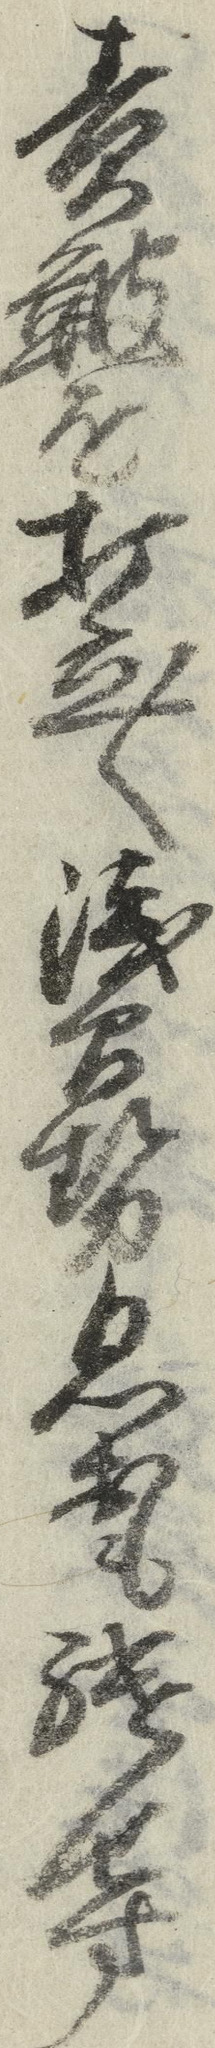責鞁を打立〳〵浅間勢息おも継せす
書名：浅間大焼騒動記　上
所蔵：東京大学地震研究所図書室 Earthquake Research Institute Library, The University of Tokyo, JAPAN
